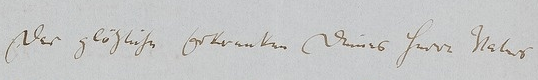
Das plötzliche Erkranken Deines Herrn Vaters
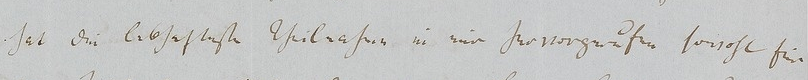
hat die lebhafteste Theilnahme in mir hervorgerufen sowohl für
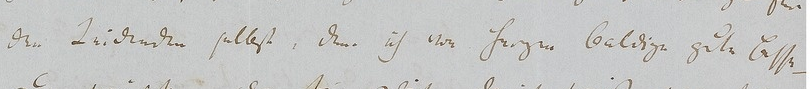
den Leidenden selbst, dem ich von Herzen baldige gute Besse-
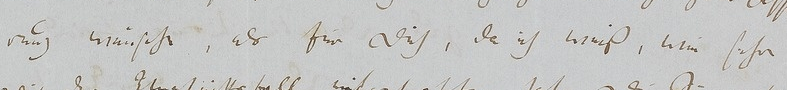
rung wünsche, als für Dich, da ich weiß, wie sehr
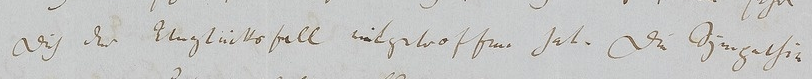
Dich der Unglücksfall mitgetroffen hat. Die Sympathie
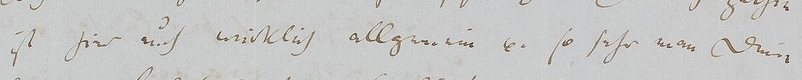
ist hier auch wirklich allgemein &. so sehr man Deine
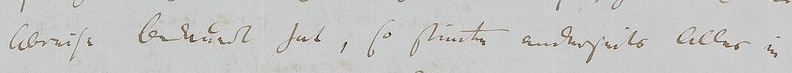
Abreise bedauert hat, so stimmte anderseits Alles in
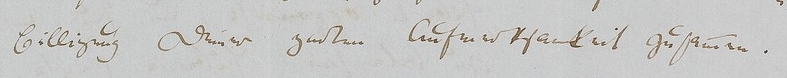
Billigung Deiner zarten Aufmerksamkeit zusammen.
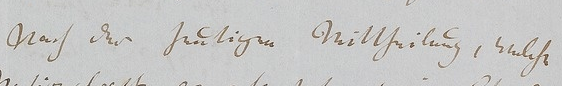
Nach der heutigen Mittheilung, welche
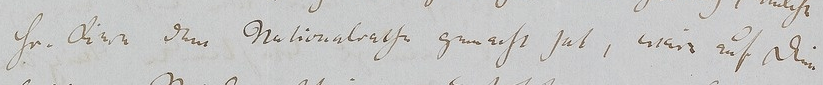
Hr. Kern dem Nationalrathe gemacht hat, wäre auf Dein
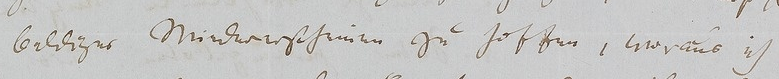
baldiges Wiedererscheinen zu hoffen, woraus ich
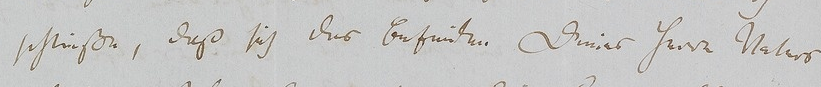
schließe, daß sich das Befinden Deines Herrn Vaters
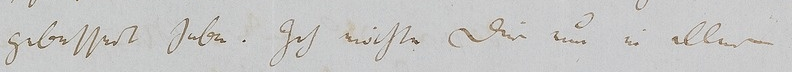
gebessert habe. Ich möchte Dir nun in aller
